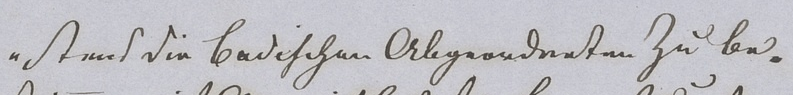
stens die badischen Abgeordneten zu be-
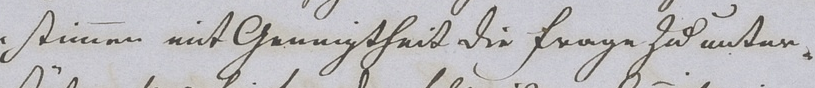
stimmen mit Geneigtheit die Frage zu unter-
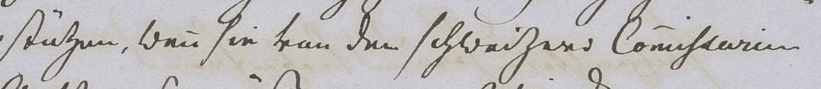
stützen, wenn sie von den schweizer. Commissarien
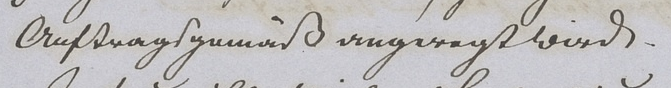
Auftragsgemäß angeregt wird.
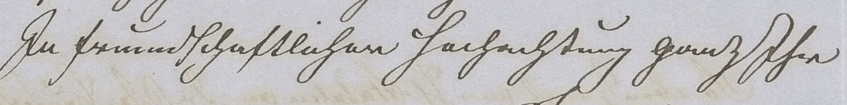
In freundschaftlicher Hochachtung ganz Ihr
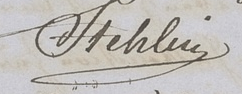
Stehlin
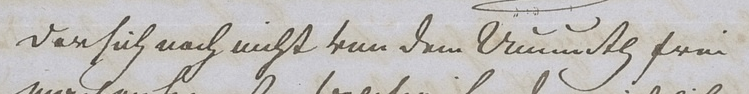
der sich noch nicht von dem Unmuth frei
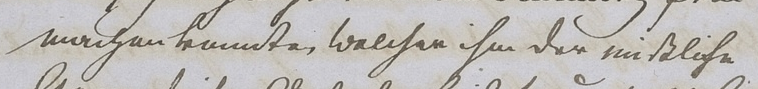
machen konnte, welcher ihm der mißliche
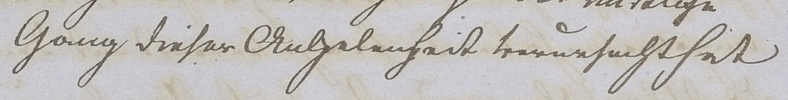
Gang dieser Angelegenheit verursacht hat.
